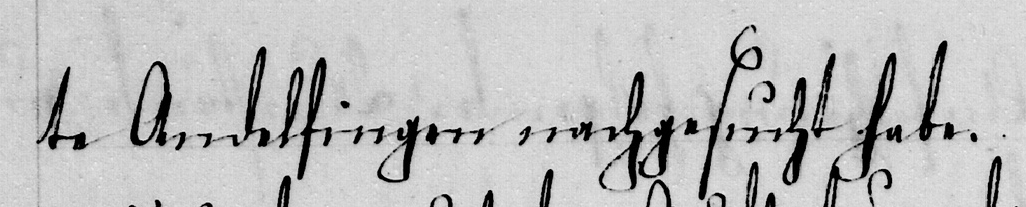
te Andelfingen nachgesucht habe.
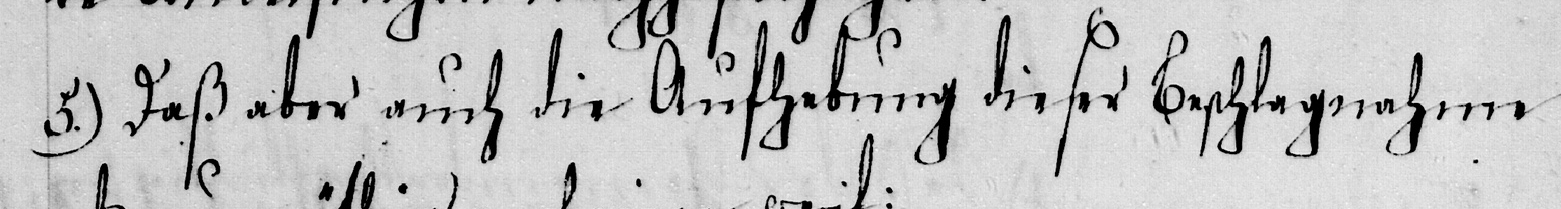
5.) Daß aber auch die Aufhebung dieser Beschlagnahme
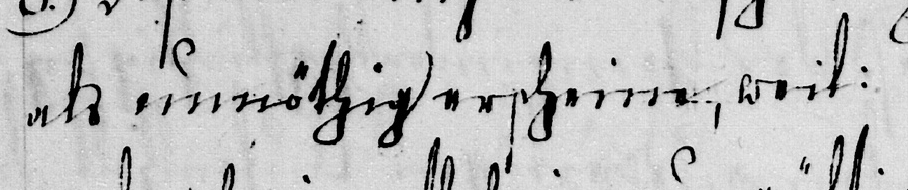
als unmöglich erscheine, weil:
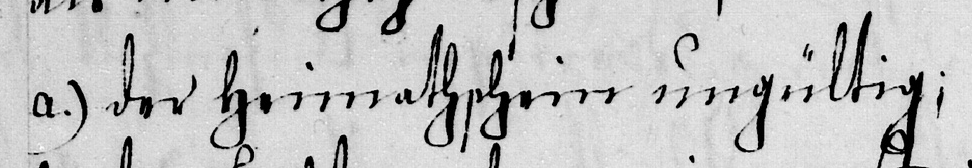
a.) der Heimathschein ungültig
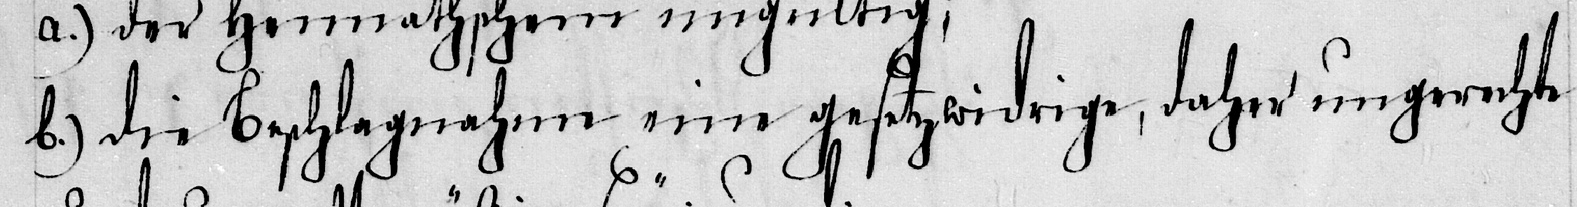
b.) die Beschlagnahme eine gesetzwidrige, daher ungerechte
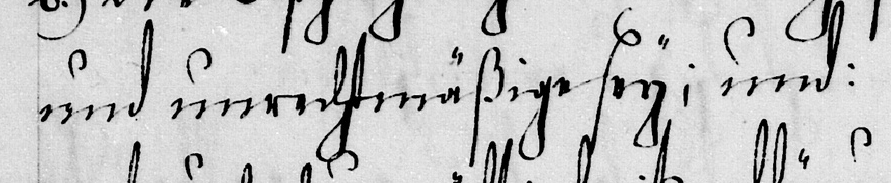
und unrechtmäßige sey; und:
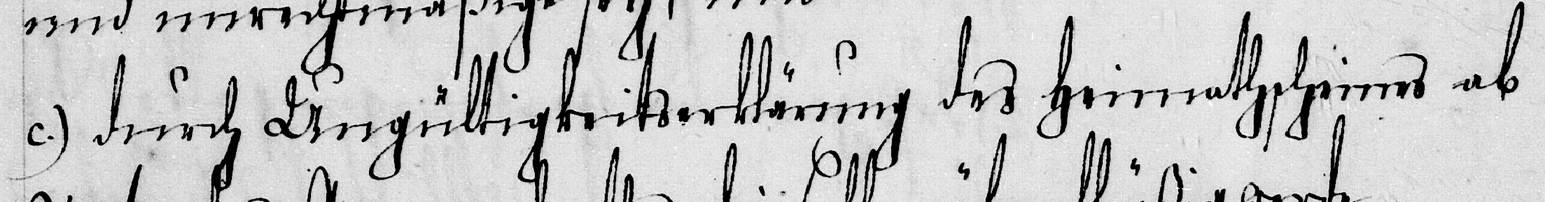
c.) durch Ungültigkeitserklärung des Heimathscheines ab
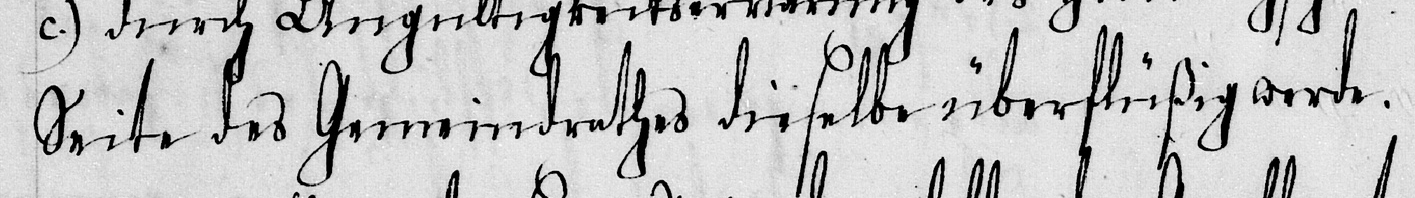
Seite des Gemeindrathes dieselbe überflüßig werde.
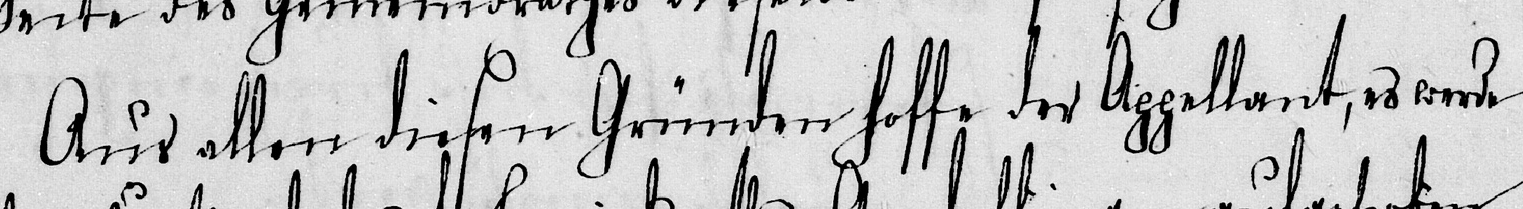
Aus allen diesen Gründen hoffe der Appellant, es
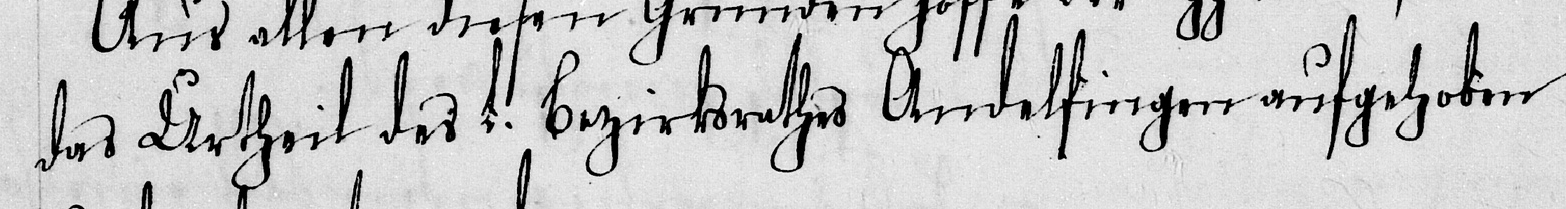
das Urtheil des L. Bezirksrathes Andelfingen aufgehoben
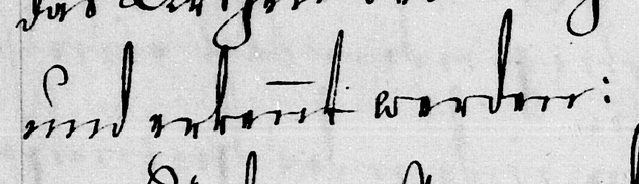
und erkennt werden:
